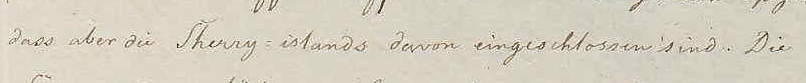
dass aber die Sherry-islands davon eingeschlossen sind. Die
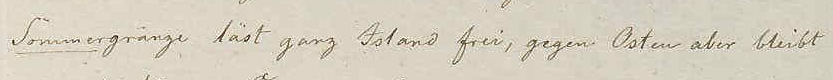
Sommergränze läst ganz Island frei, gegen Osten aber bleibt
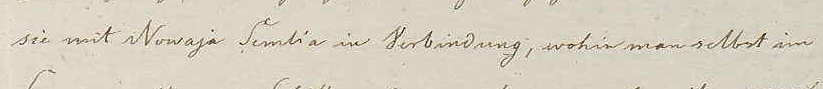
sie mit Nowaja Semlia in Verbindung, wohin man selbst im
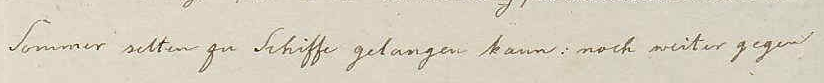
Sommer selten zu Schiffe gelangen kann: noch weiter gegen
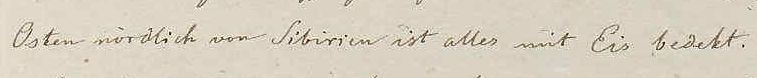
Osten nördlich von Sibirien ist alles mit Eis bedekt.
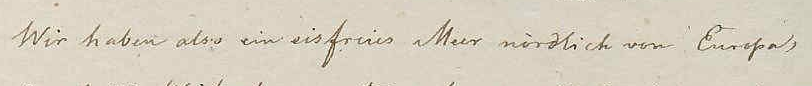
Wir haben also ein eisfreies Meer nördlich von Europa,
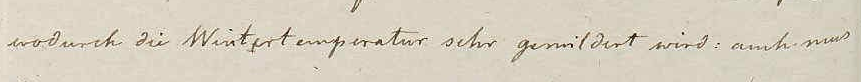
wodurch die Wintertemperatur sehr gemildert wird: auch mus
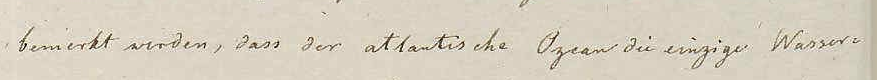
bemerkt werden, dass der atlantische Ozean die einzige Wasser-
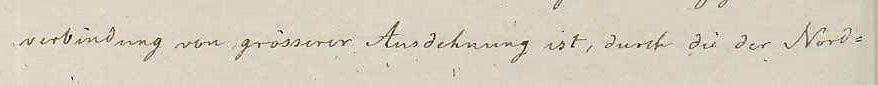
verbindung von grösserer Ausdehnung ist, durch die der Nord-
